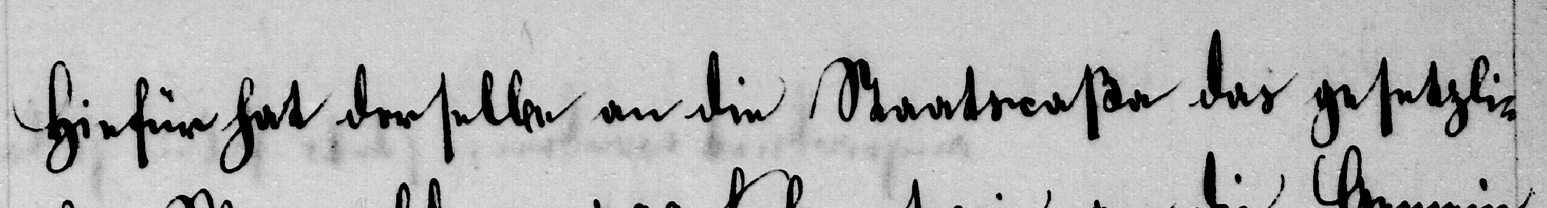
Hiefür hat derselbe an die Staatscaße das gesetzli¬
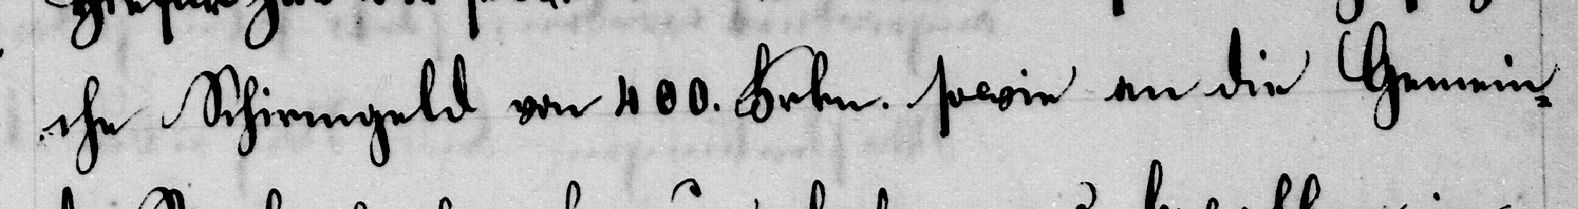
che Schirmgeld von 400. Frk[en]. sowie an die Gemein¬
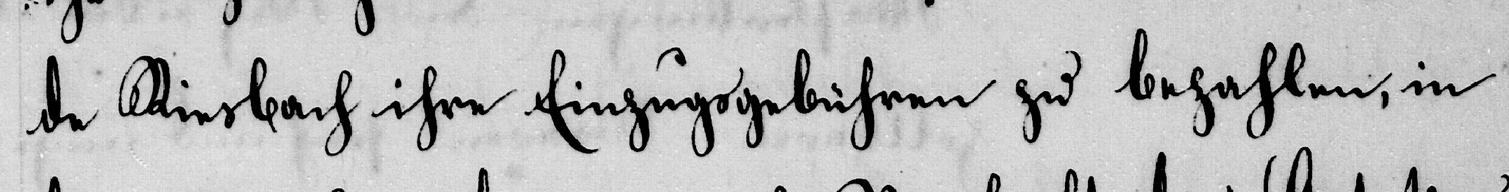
de Riesbach ihre Einzugsgebühren zu bezahlen, in
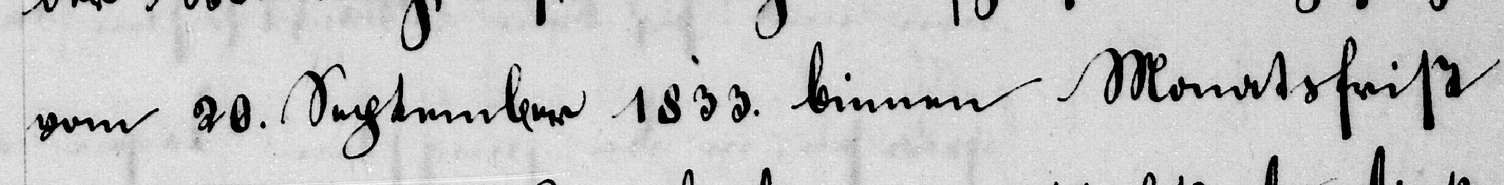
vom 20. September 1833. binnen Monatsfrist
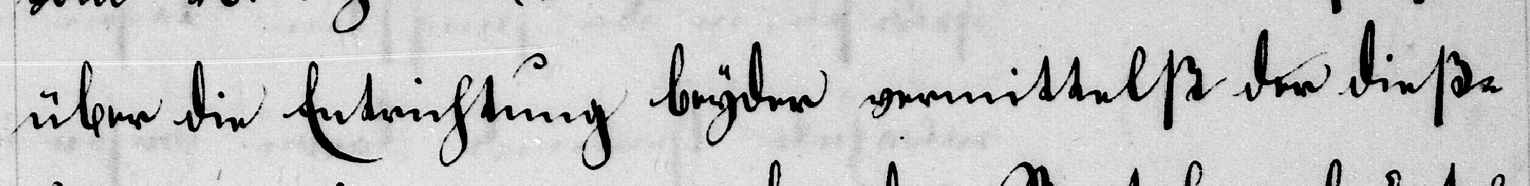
über die Entrichtung beyder vermittelst der dieß¬
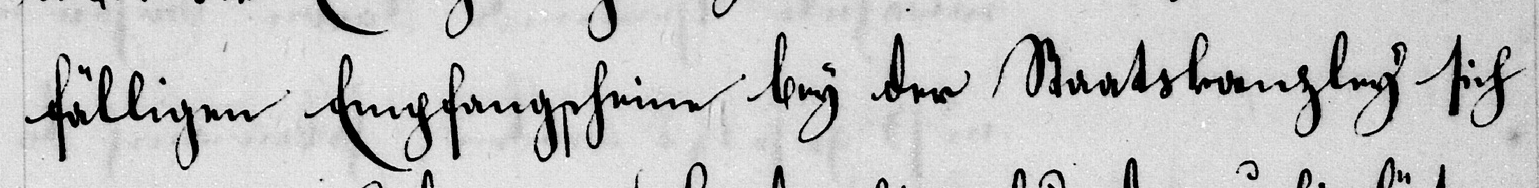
fälligen Empfangscheins bey der Staatskanzley sich
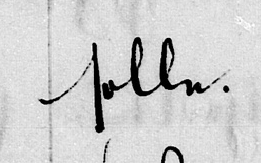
solle.
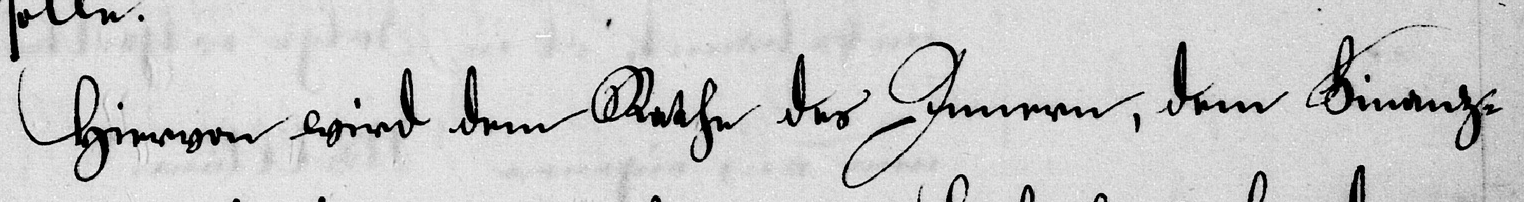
Hievon wird dem Rathe des Innern, dem Finanz¬
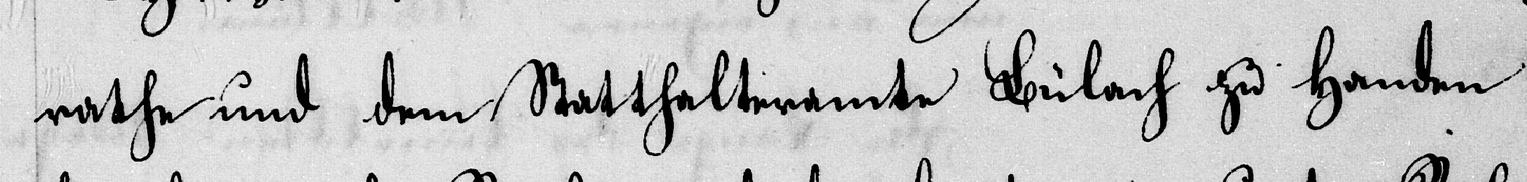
rathe und dem Statthalteramte Bülach zu Handen
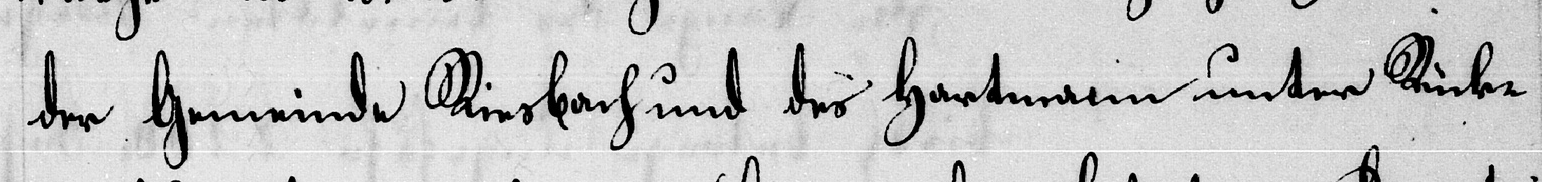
der Gemeinde Riesbach und des Hartmann unter Rück¬
